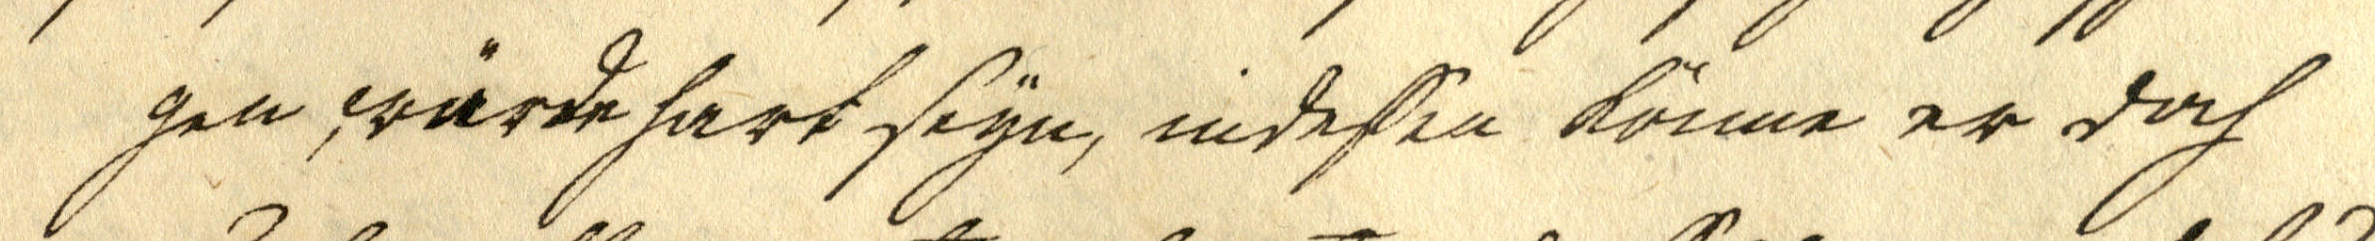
gen würde hart seyn , indessen könne er doch
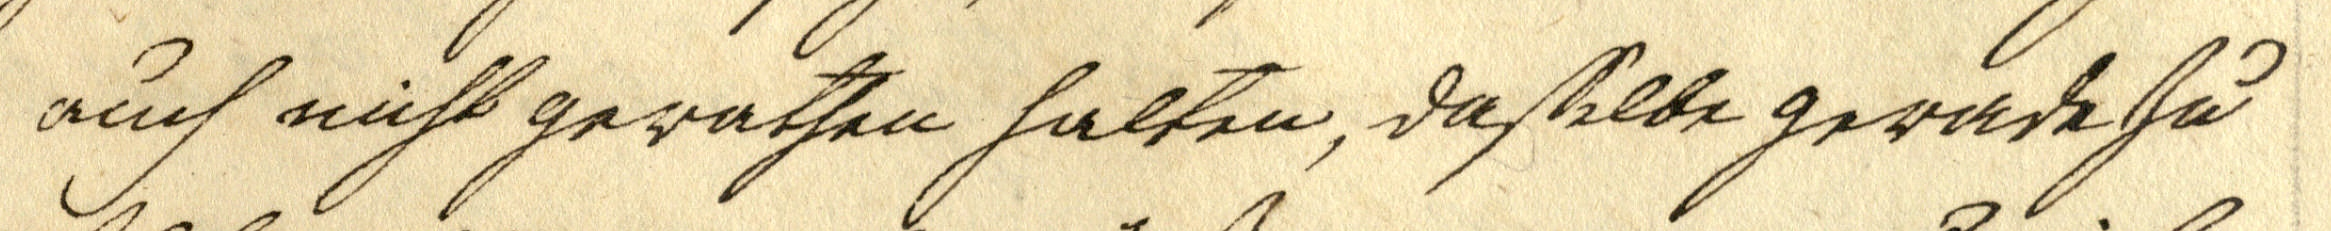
auch nicht gerathen halten , dasselbe gerade zu
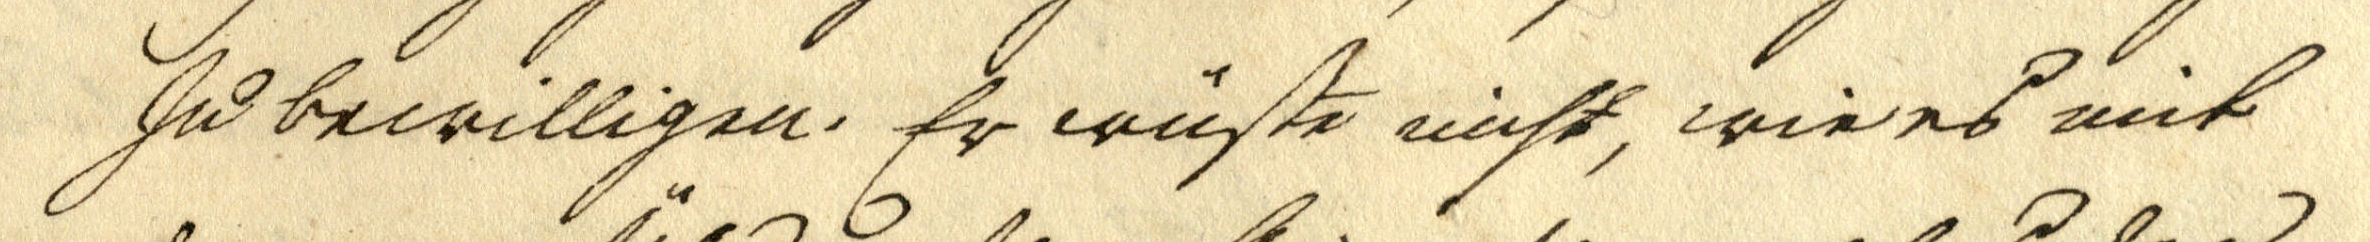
zu bewilligen sr wüste nicht , wie es nimt
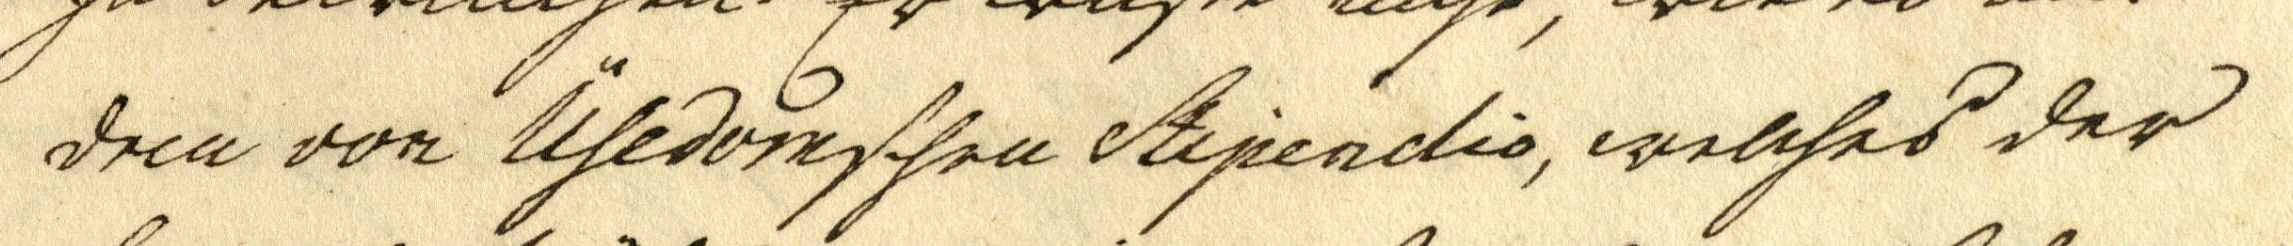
denn von Schwedischen Stipendia , welches der
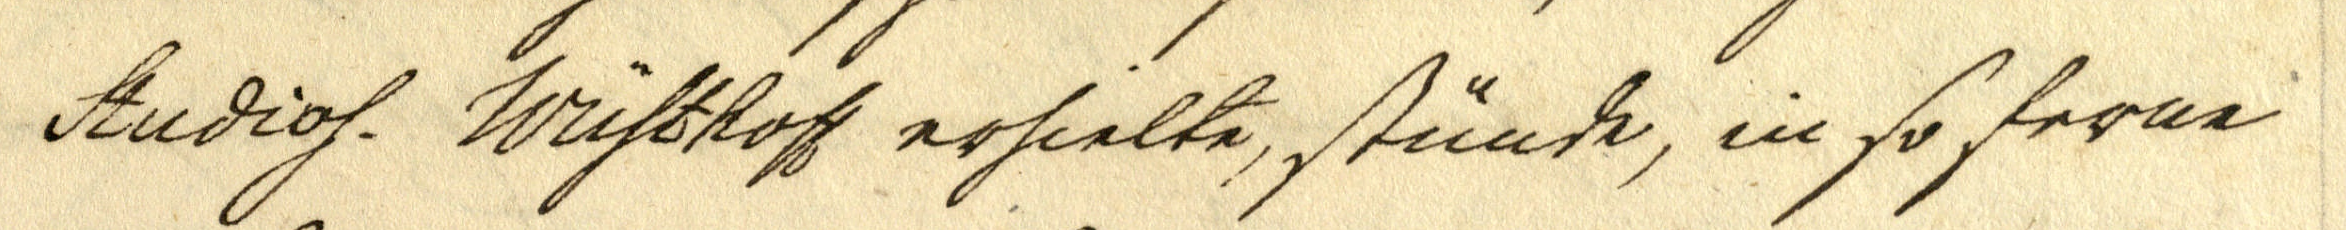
Studios Wohlthat erhielte , stünde , in so ferne
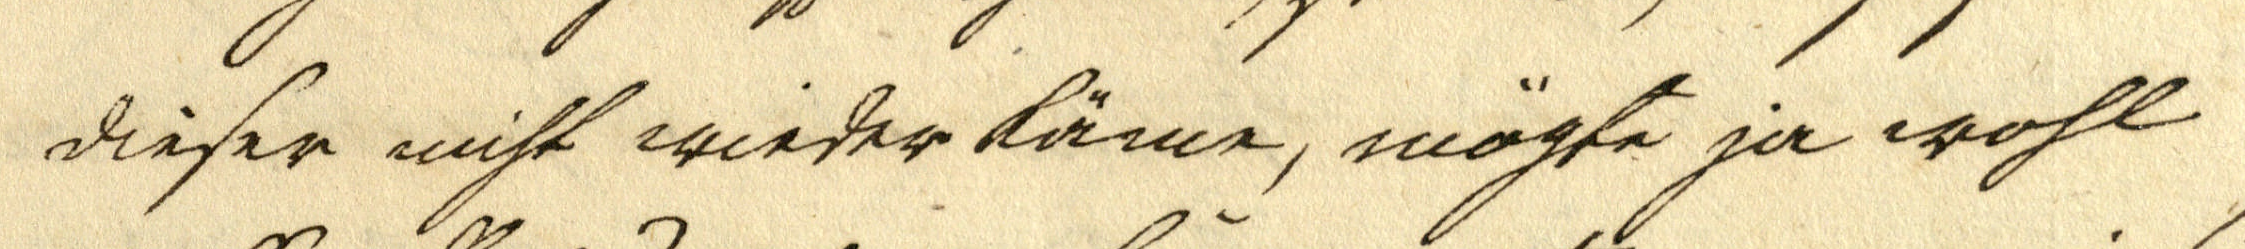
dieser nicht wieder könne , mögte ha wohl
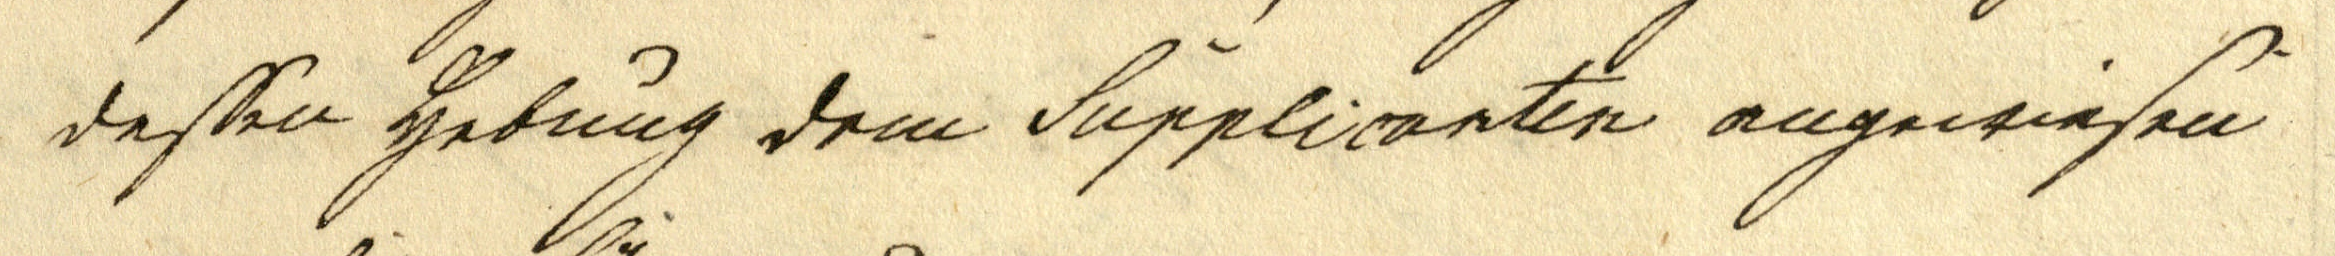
dessen Hebung den Supplicanten angewiesen
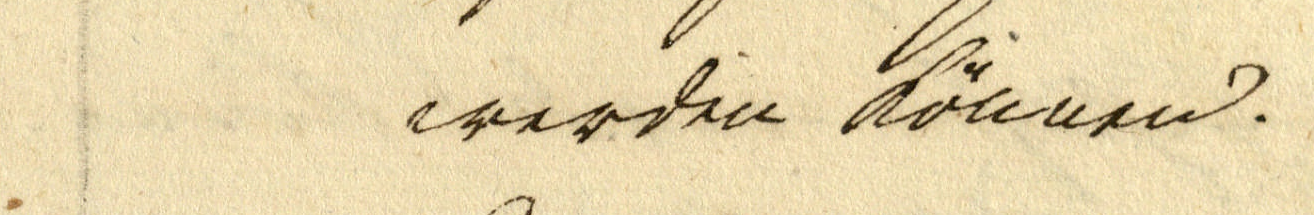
werden können
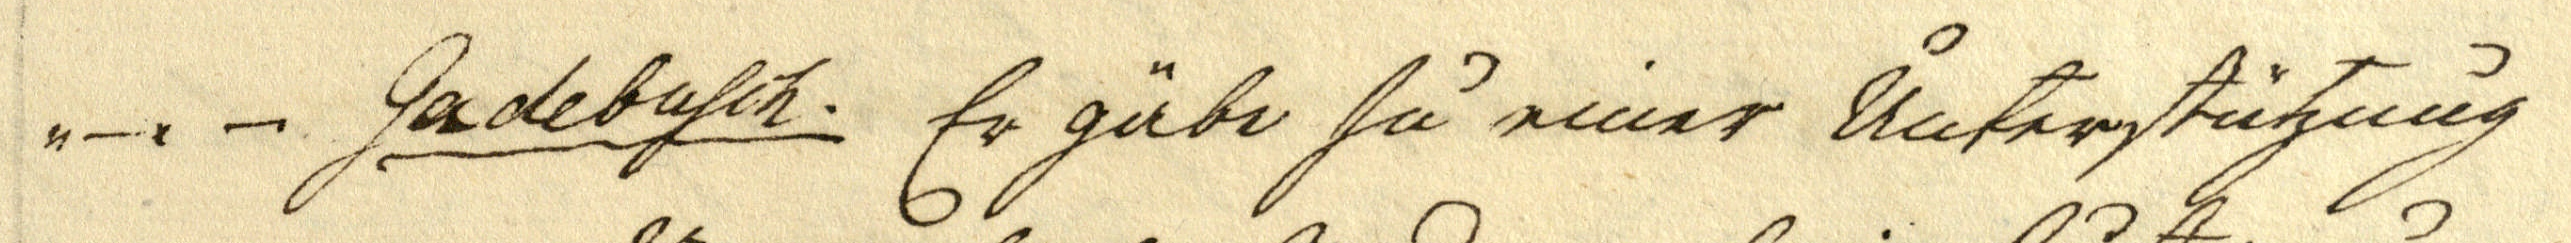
'"' - sollte Er gäbe zu einer d.h .
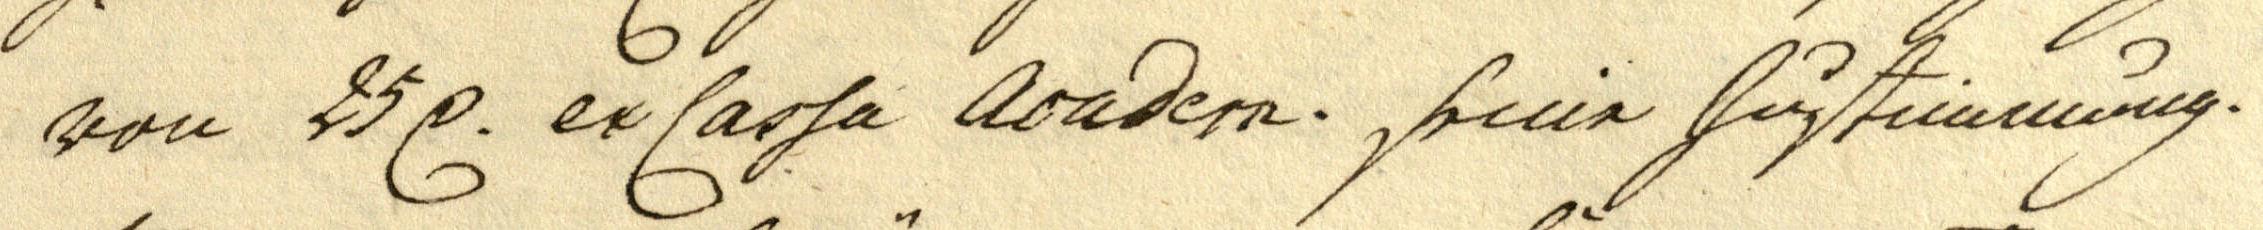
von der C . er Crohn Academ seine Zustimmung
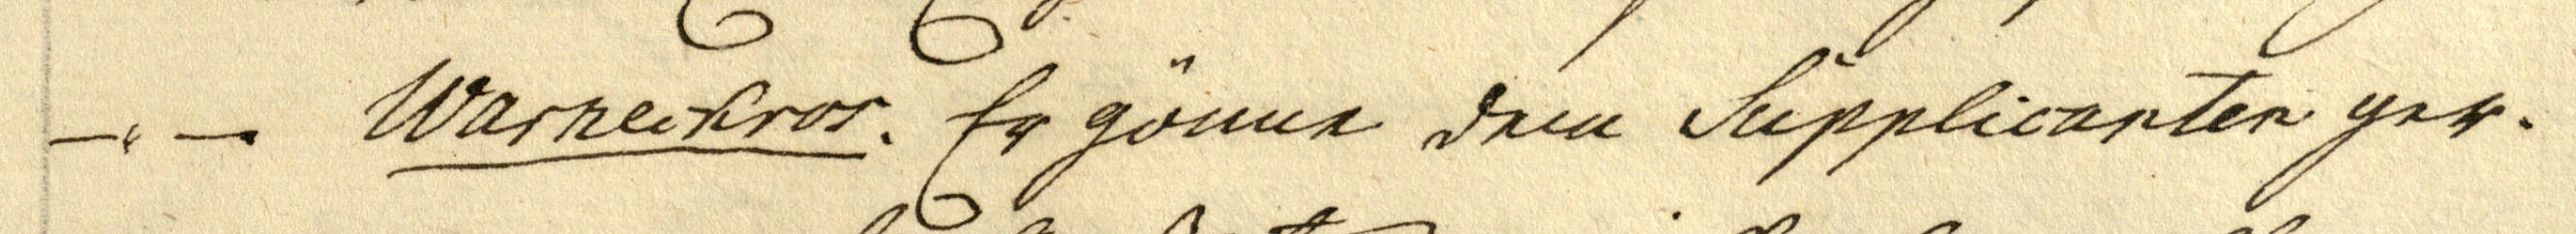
- Welche Er gerne denn Supplicanten gar
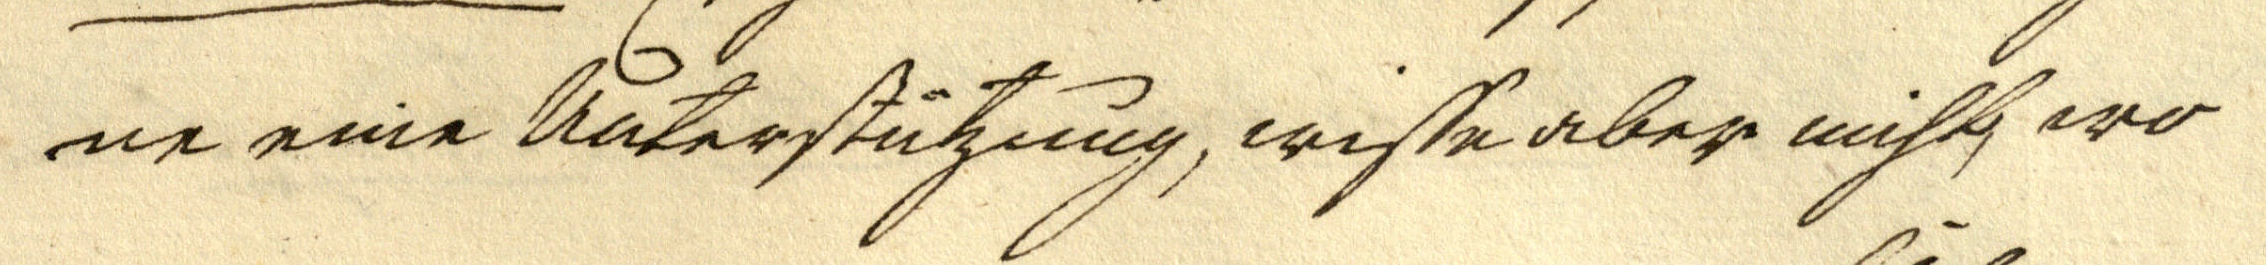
me eine Unterstützung , wisse aber nicht wo
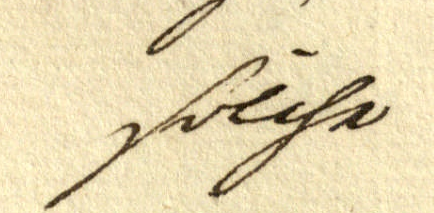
auch
